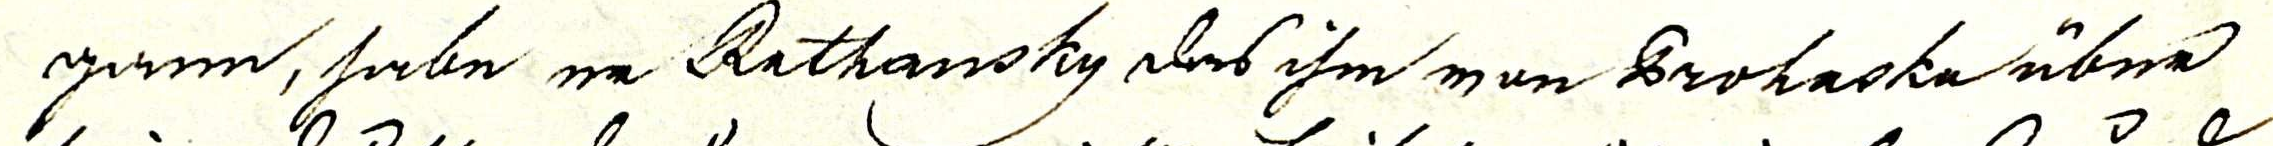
gann, habe er Rathansky das ihm von Prohaska über
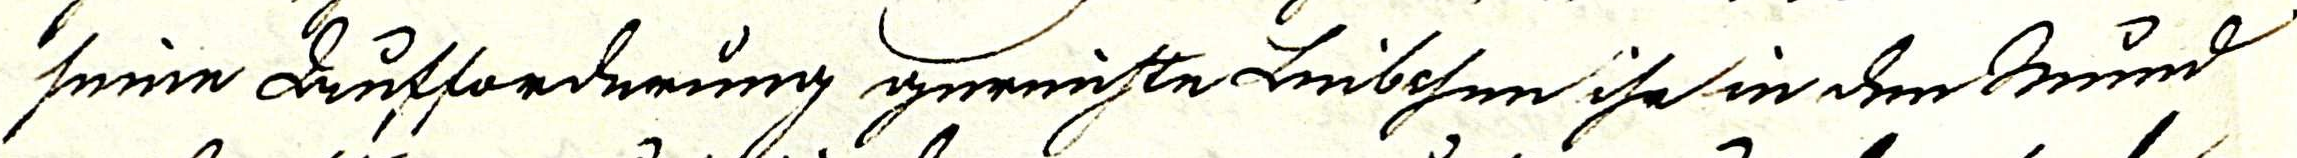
seine Aufforderung gereichte Leibchen ihr in den Mund
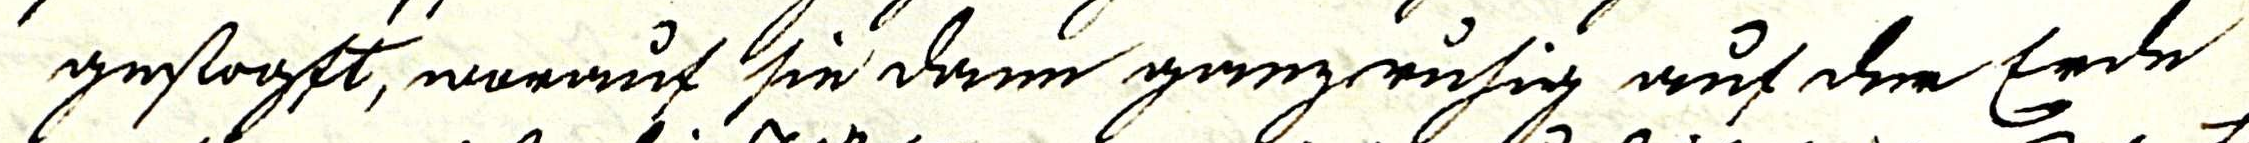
gestopft, worauf sie dann ganz ruhig auf der Erde
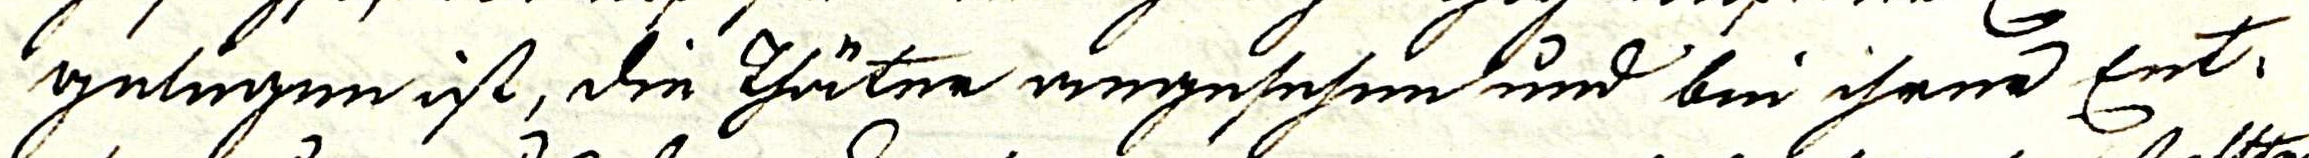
gelegen ist, die Thäter angesehen und bei ihrer Ent¬
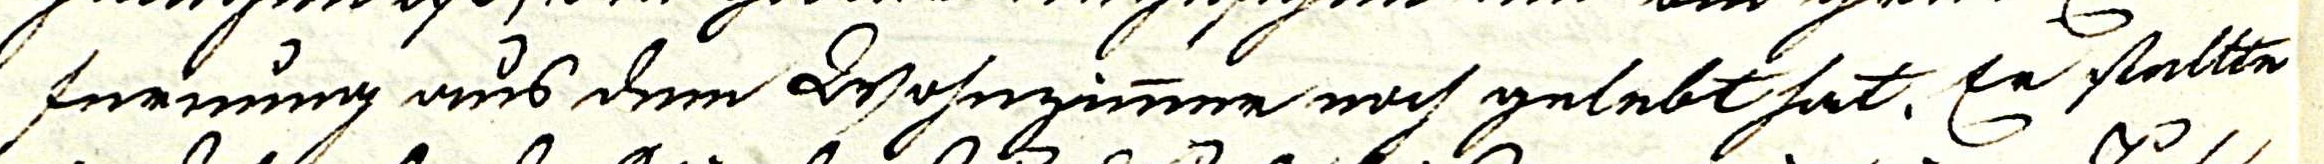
fernung aus dem Wohnzimmer noch gelebt hat. Er stellte
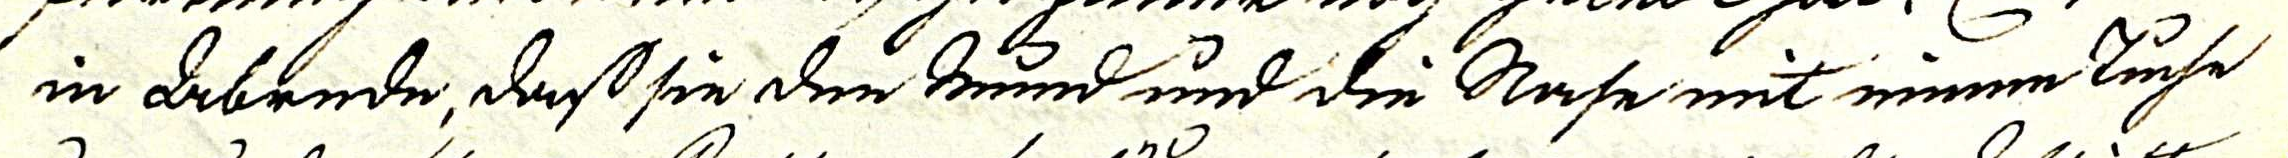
in Abrede, daß sie den Mund und die Nase mit einem Tuche
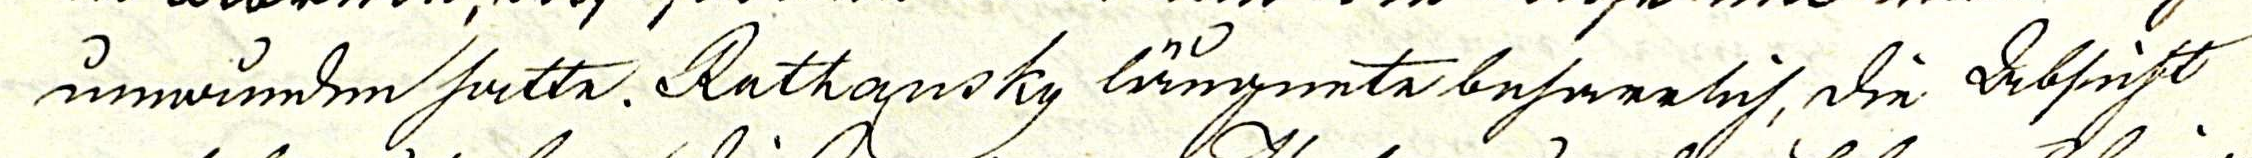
umwunden hatte. Rathansky läugnete beharrlich, die Absicht
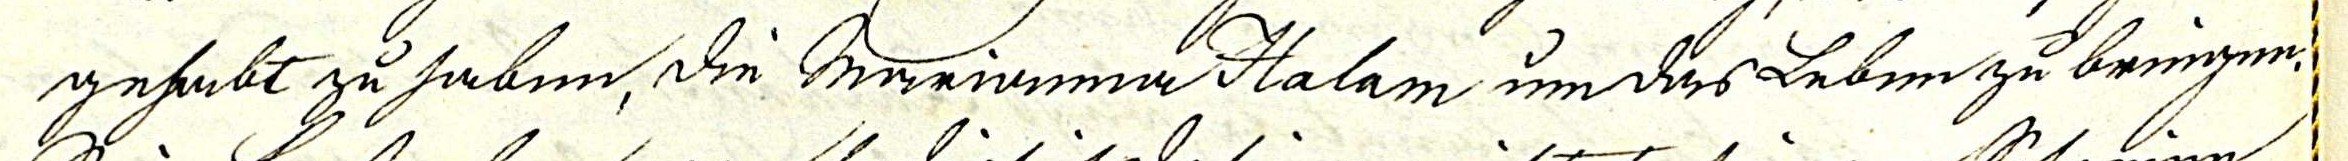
gehabt zu haben, die Marianna Halam um das Leben zu bringen.
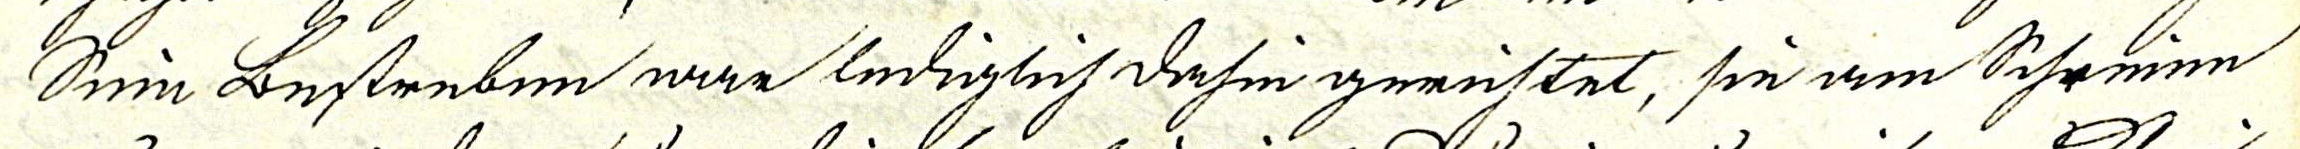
Sein Bestreben war lediglich dahin gerichtet, sie am Schreien
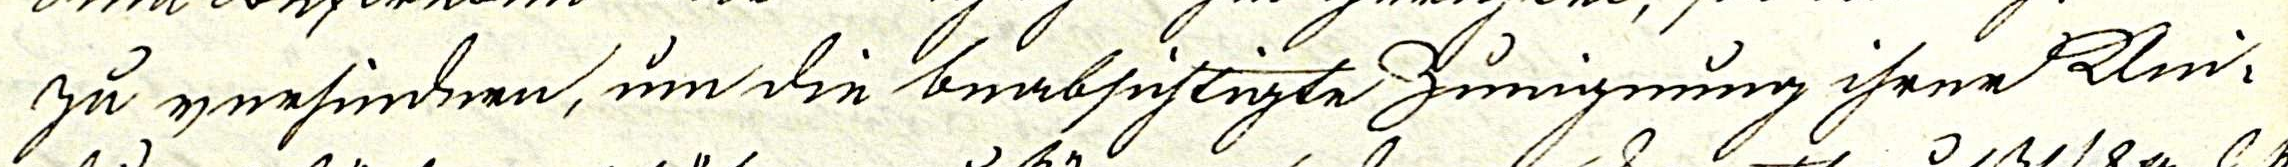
zu verhindern, um die beabsichtigte Zuneigung ihrer Klei¬
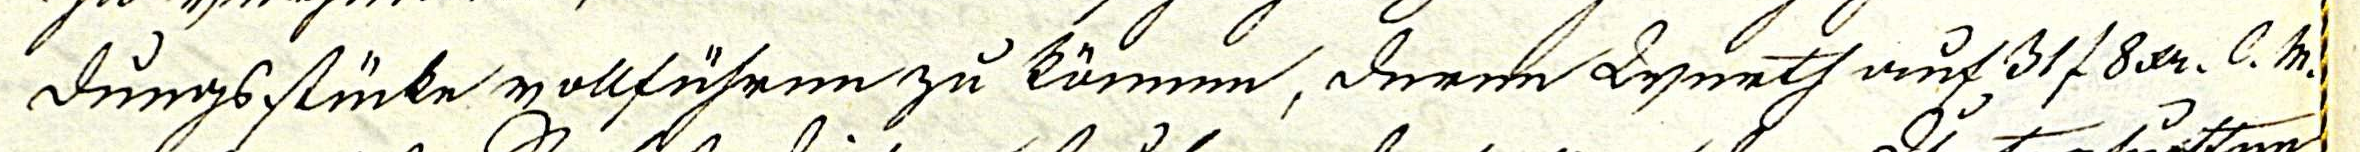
dungsstücke vollführen zu können, deren Werth auf 31f 8x C.M.
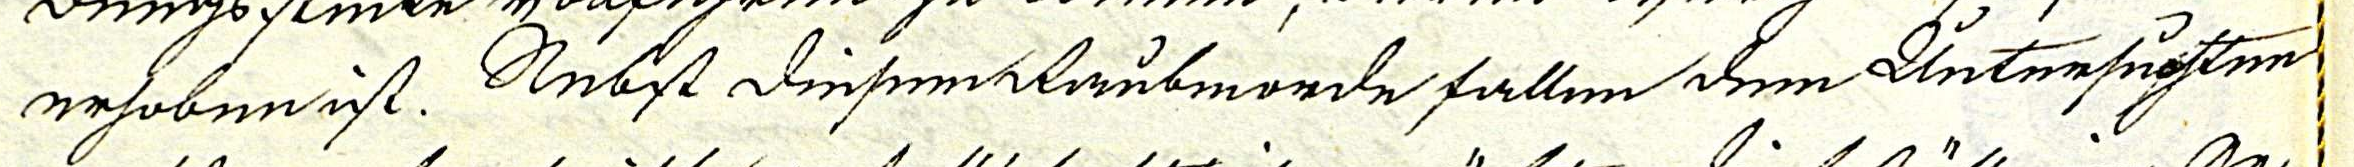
erhoben ist. Nebst diesem Raubmorde fallen dem Untersuchten
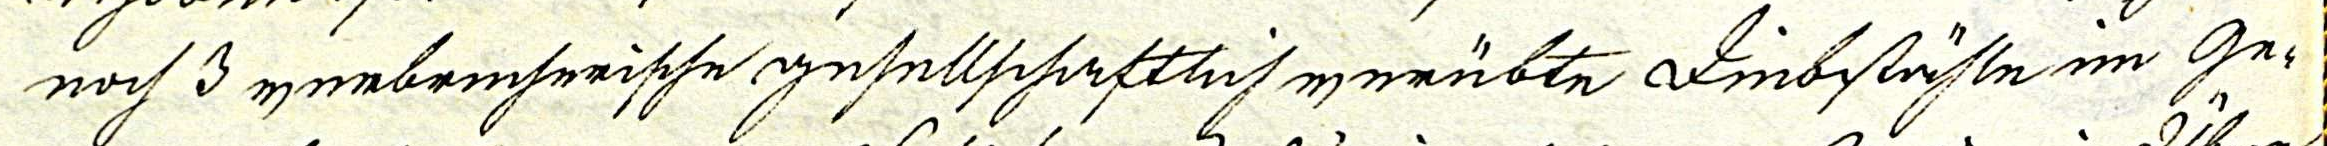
noch 3 verbrecherisch gesellschaftlich verübte Diebstähle im Ge¬
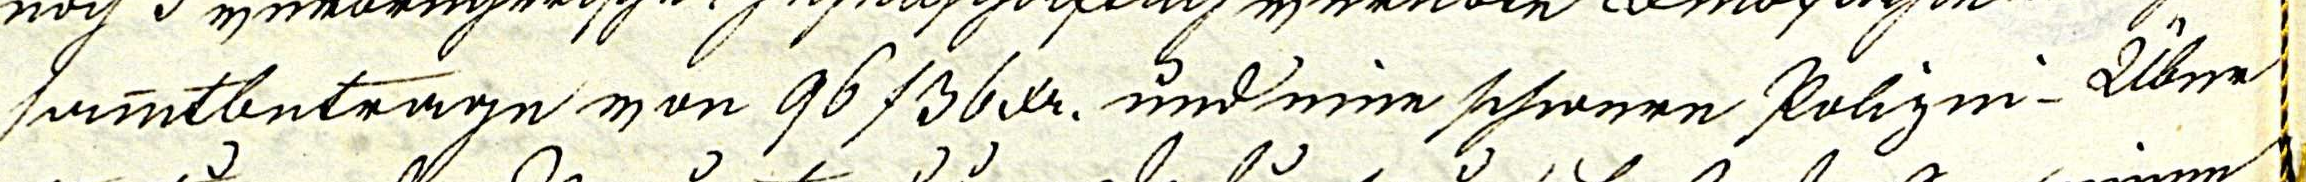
sammtbetrage von 96f 36x und eine schweren Polizei-Über¬
